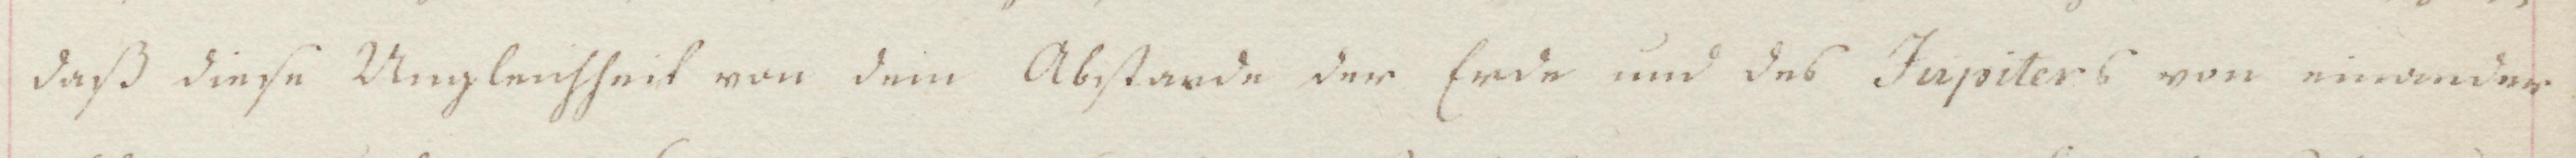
daß diese Ungleichheit von dem Abstande der Erde und des Jupiters von einander
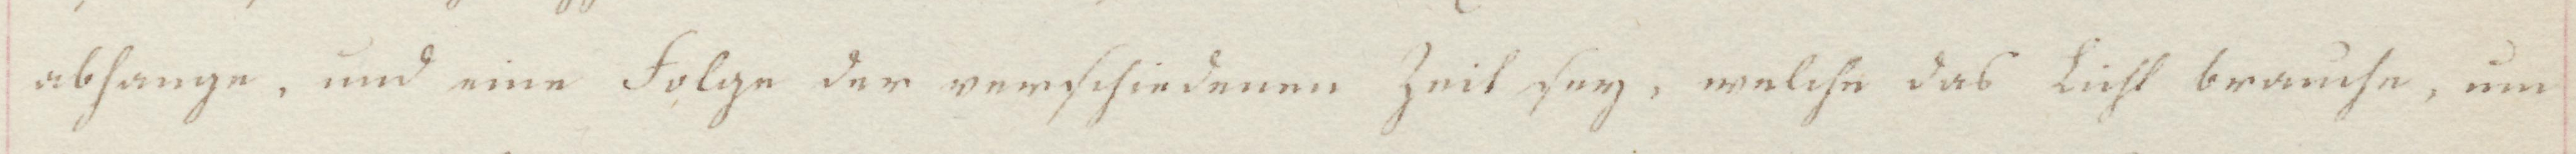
abhange, und eine Folge der verschiedenen Zeit sey, welche das Licht brauche, um
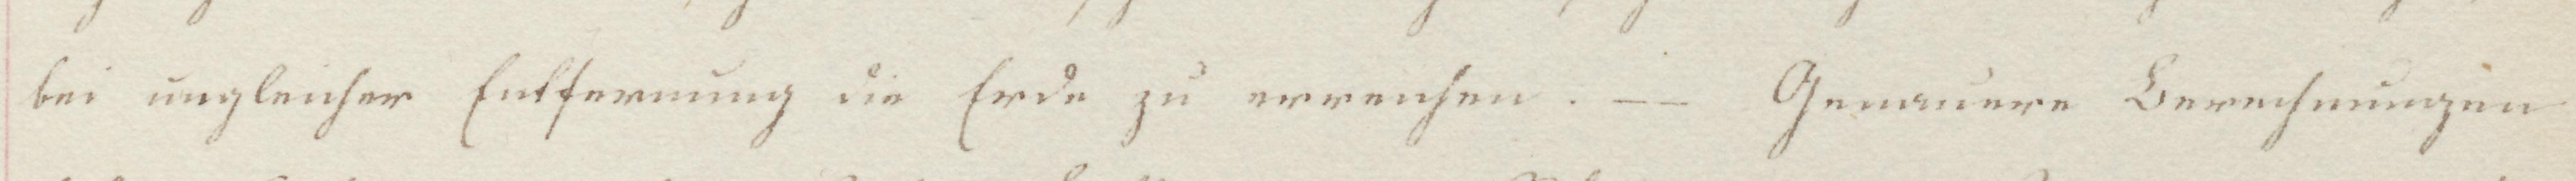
bei ungleicher Entfernung die Erde zu erreichen. – Genauere Berechnungen
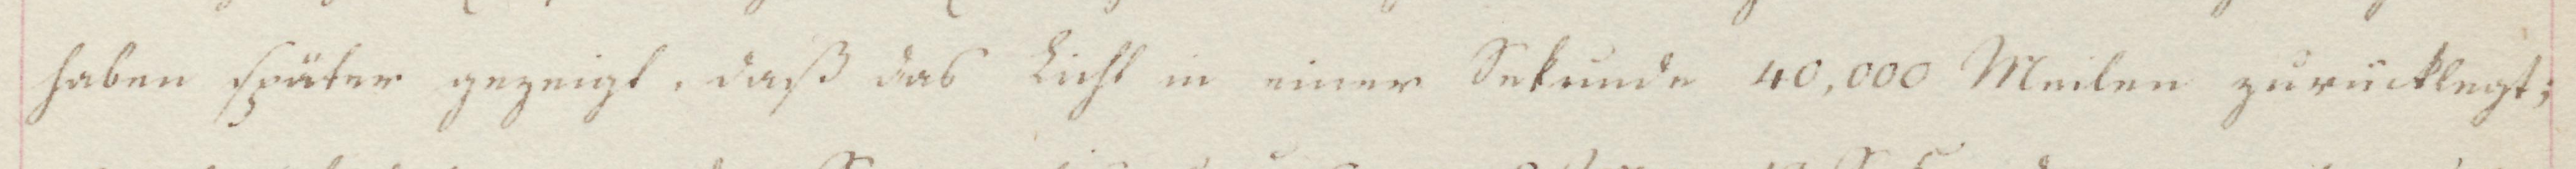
haben später gezeigt, daß das Licht in einer Sekunde 40,000 Meilen zurücklegt;
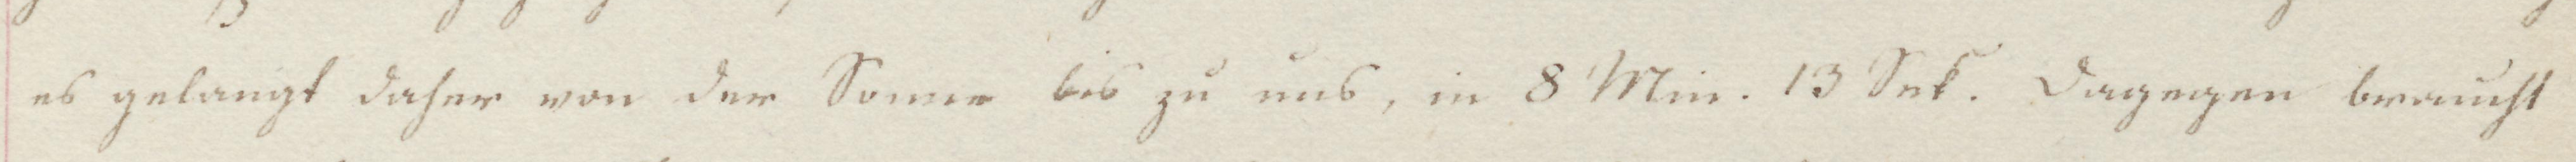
es gelangt daher von der Sonne bis zu uns, in 8 Min. 13 Sek. Dagegen braucht
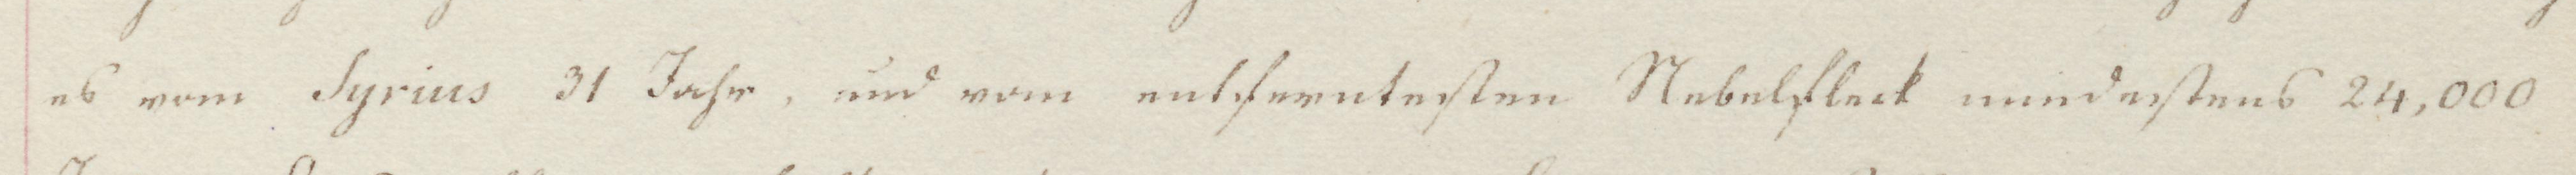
es vom Syrius 31 Jahr, und vom entferntesten Nebelfleck mindestens 24,000
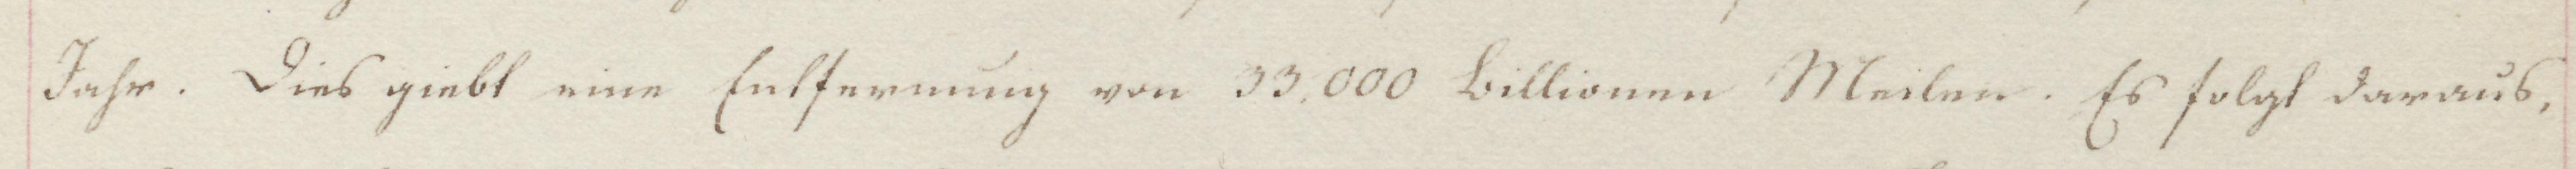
Jahr. Dies giebt eine Entfernung von 33,000 Billionen Meilen. Es folgt daraus,
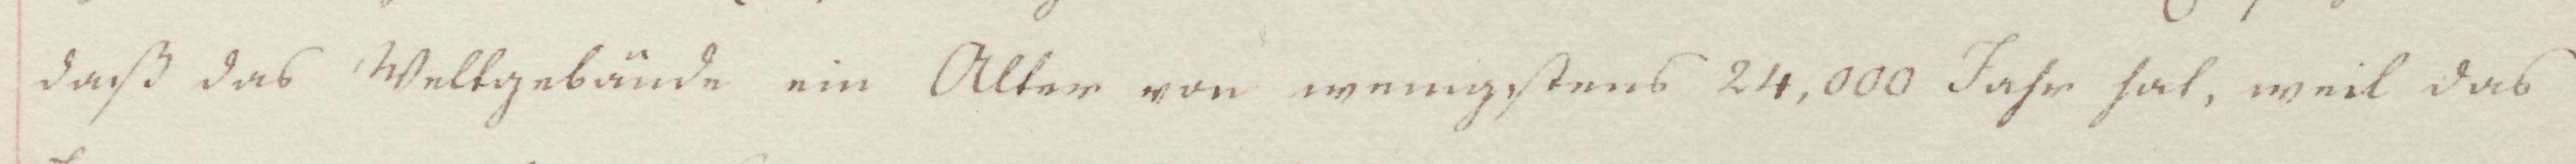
daß das Weltgebäude ein Alter von wenigstens 24,000 Jahr hat, weil das
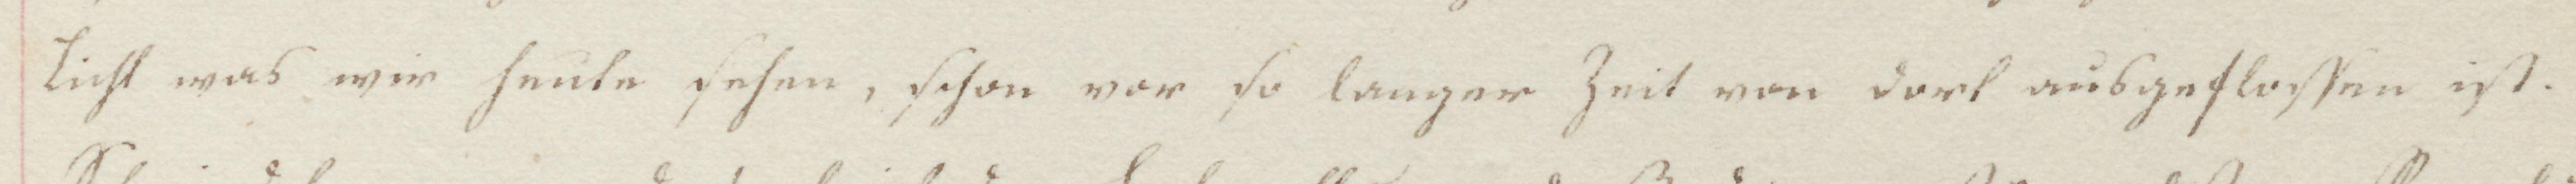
Licht was wir heute sehen, schon vor so langer Zeit von dort ausgeflossen ist.
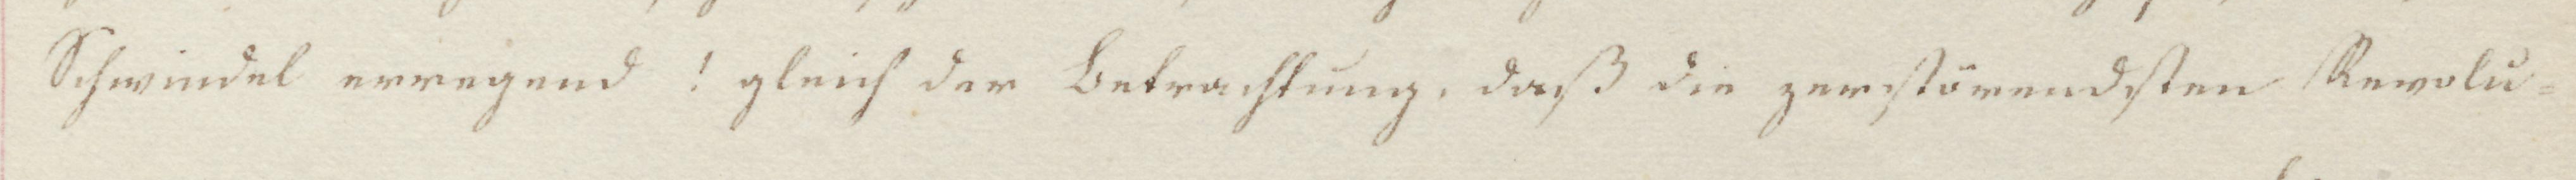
Schwindel erregend! gleich der Betrachtung, daß die zerstörendsten Revolu-
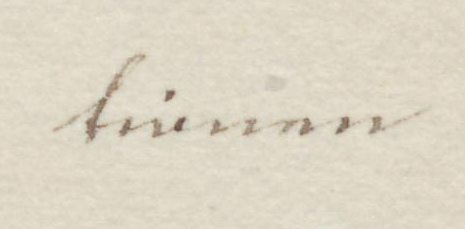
tionen
